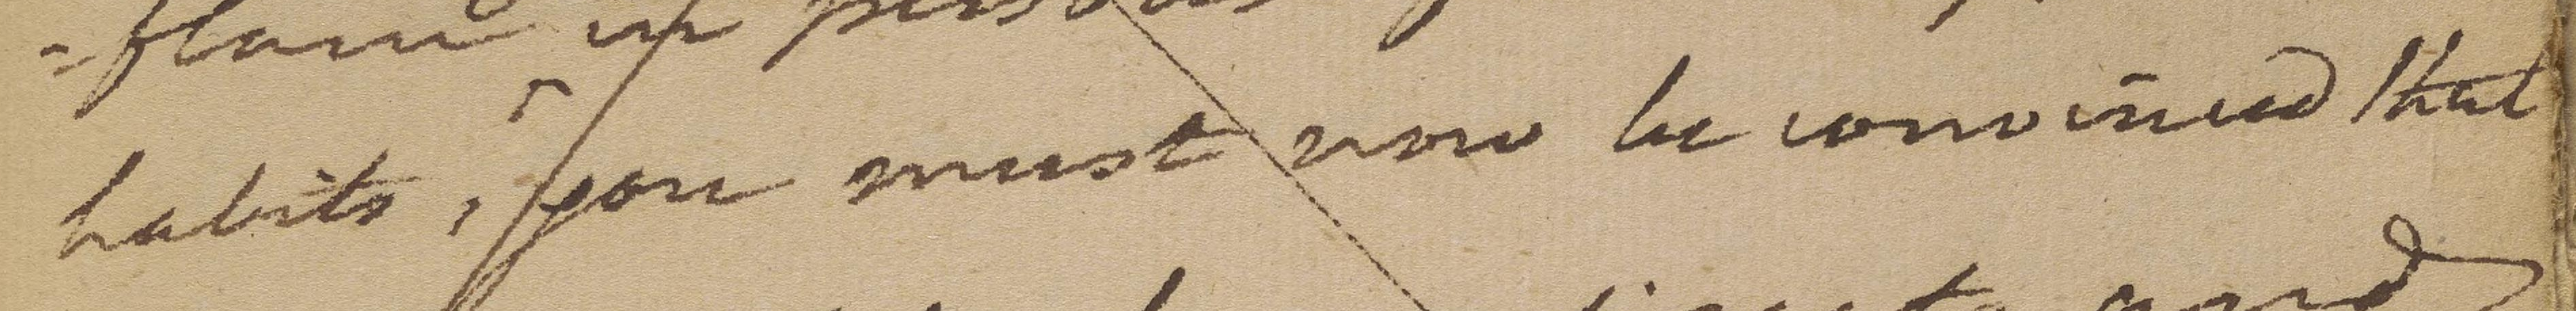habits, you must now be convinced that
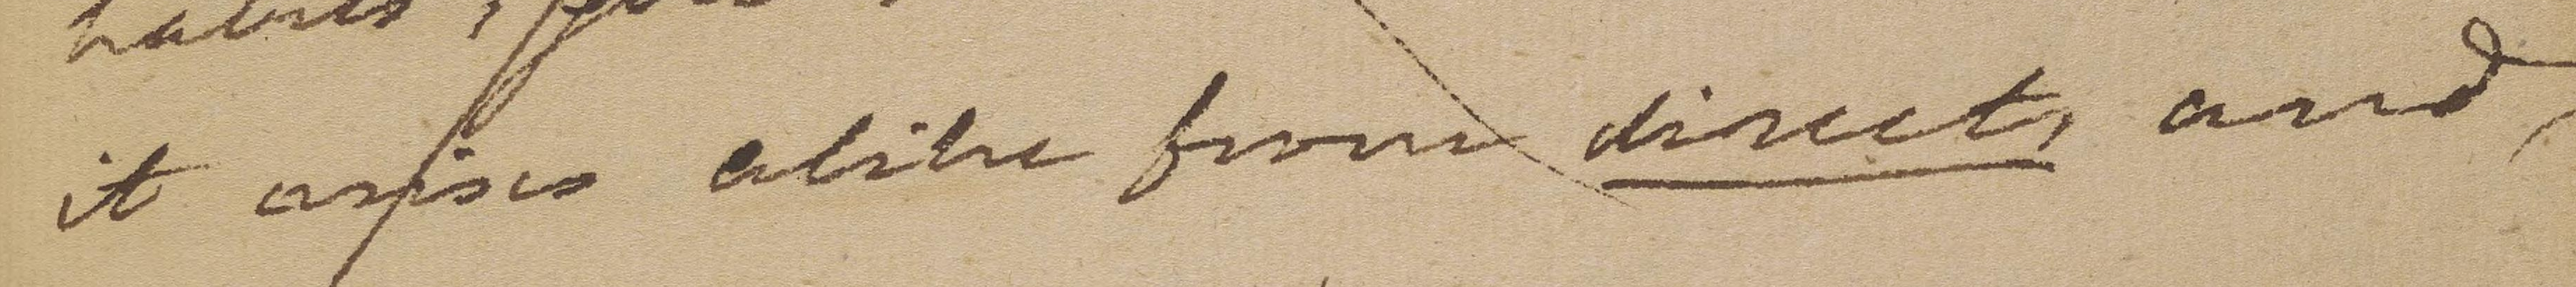it arises alike from direct, and
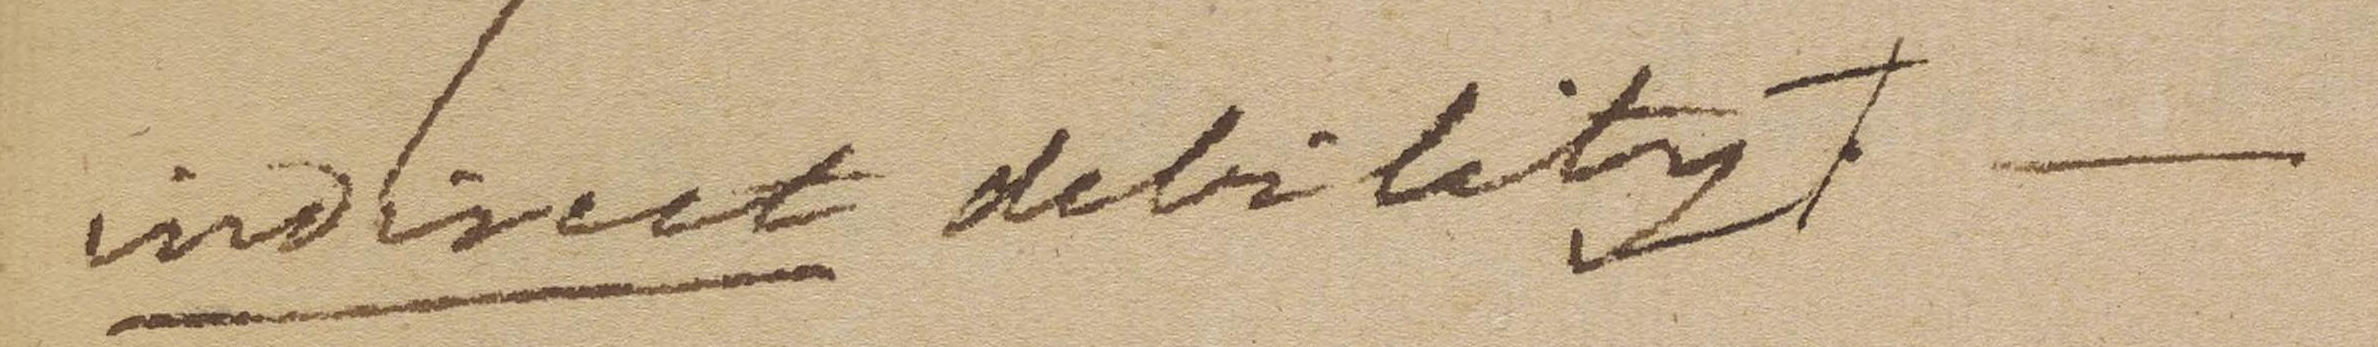indirect debility.)
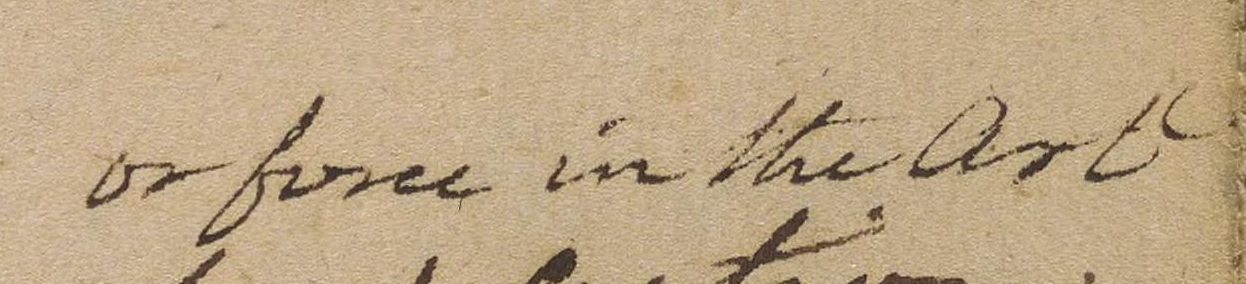or force in the Art^l
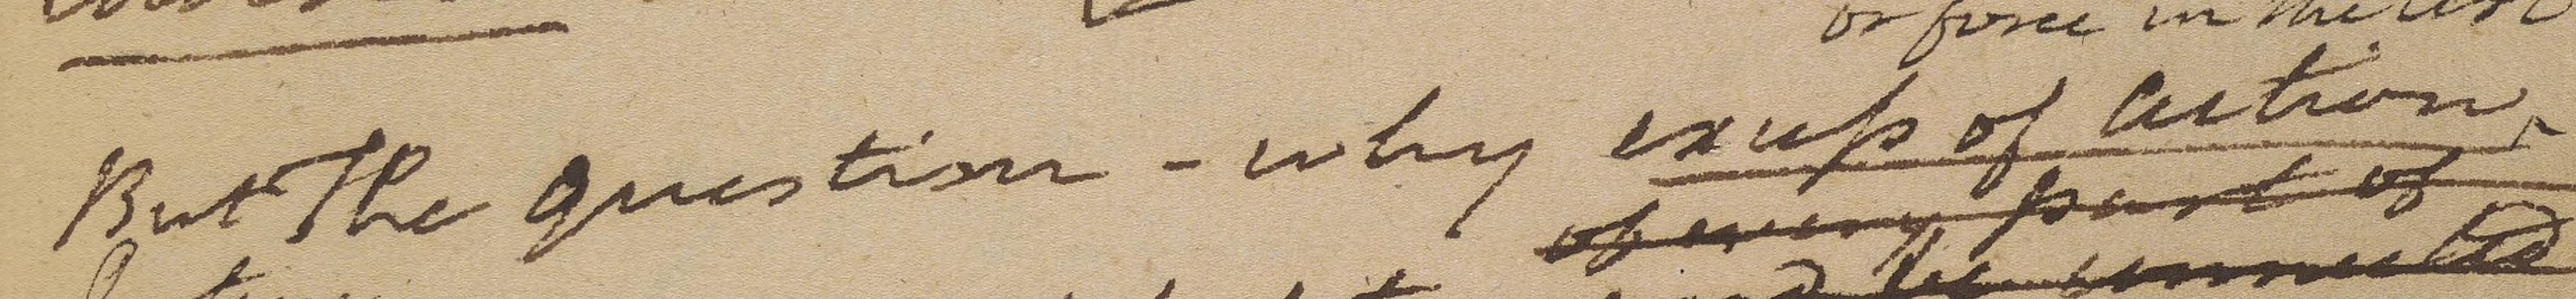But the question, why excess of action ^
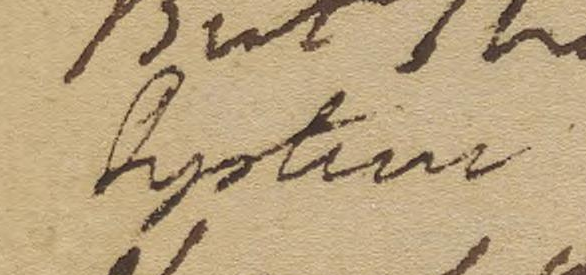System
